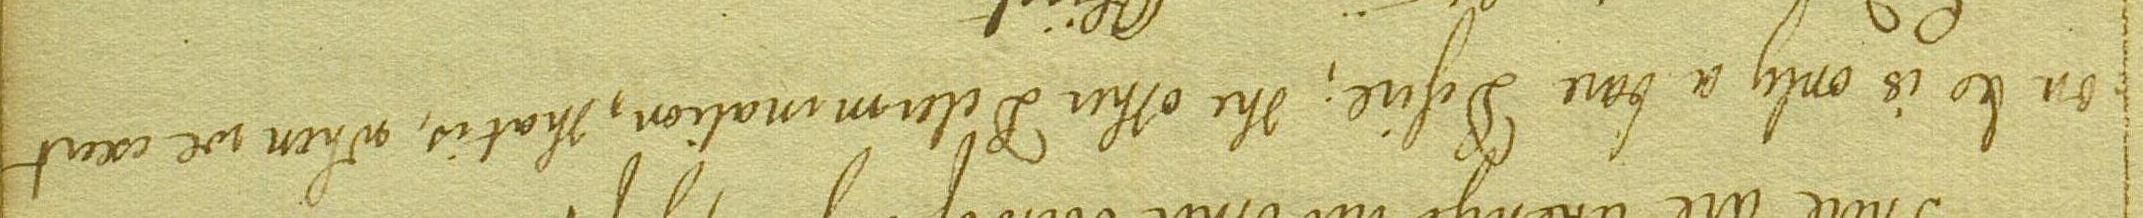on & is only a base Desire; the other Determination, that is, when we exert
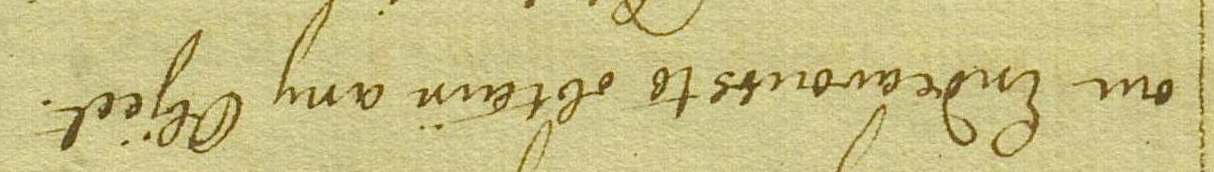our Endeavours to obtain any Object.
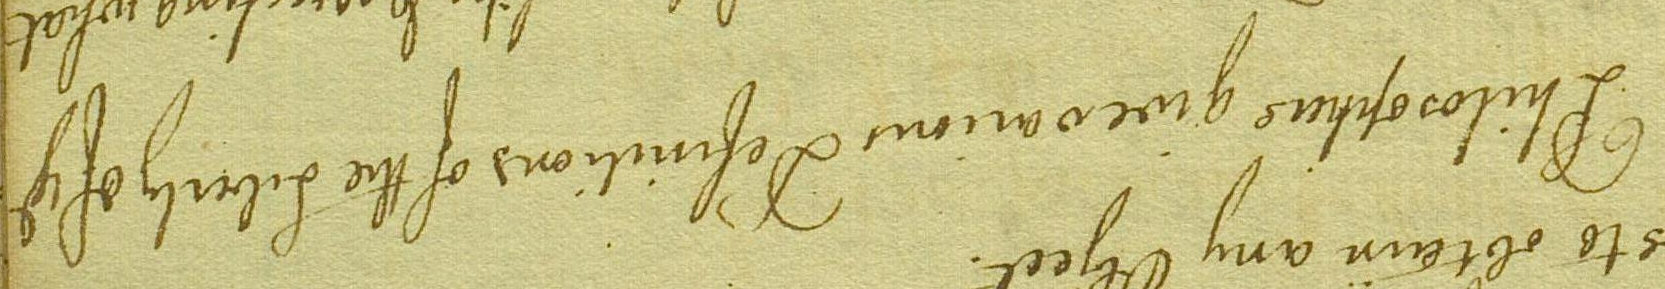Philosophers give various Definitions of the Liberty of y^e
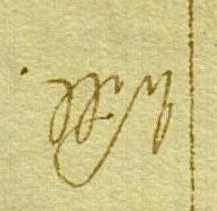Will.
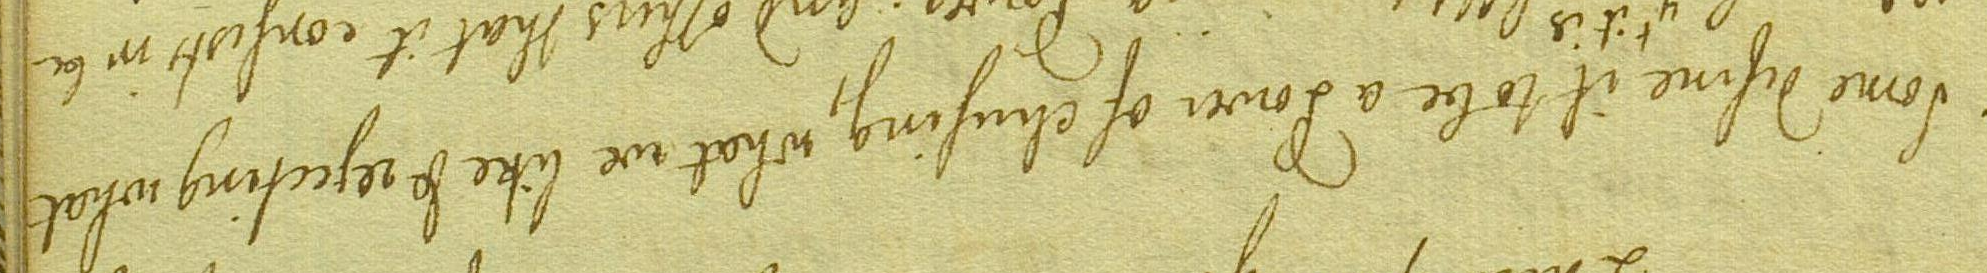Some define it to be a Power of chusing, what we like & rejecting what
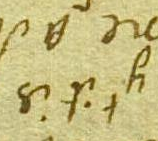y^t it is
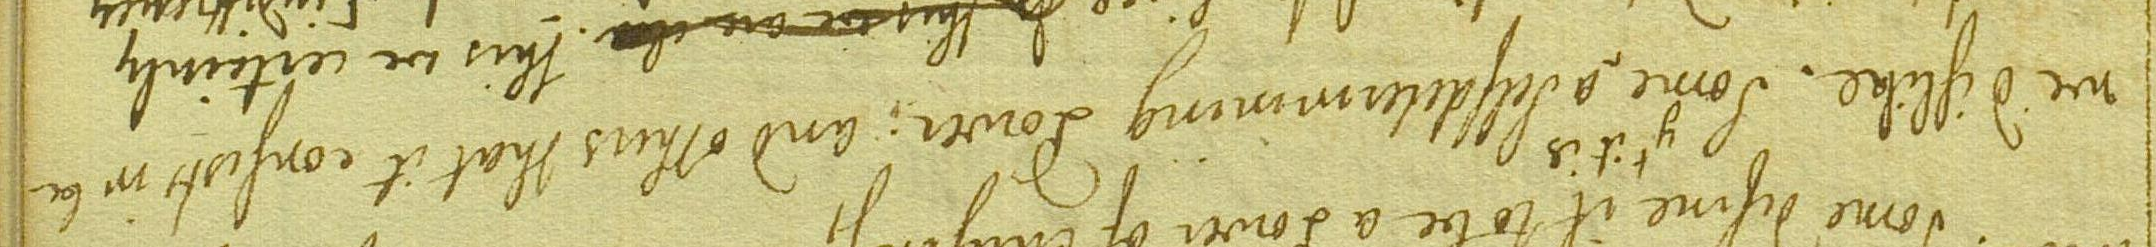we dislike. Some ^ a Selfdetermining Power; and others that it consists in be
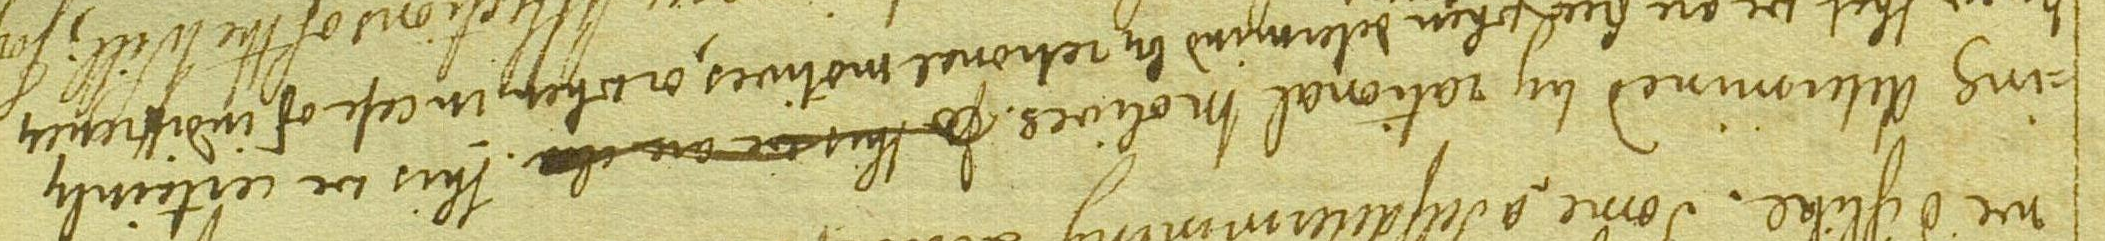-ing determined by rational motives. In this we are [__]. This we certainly
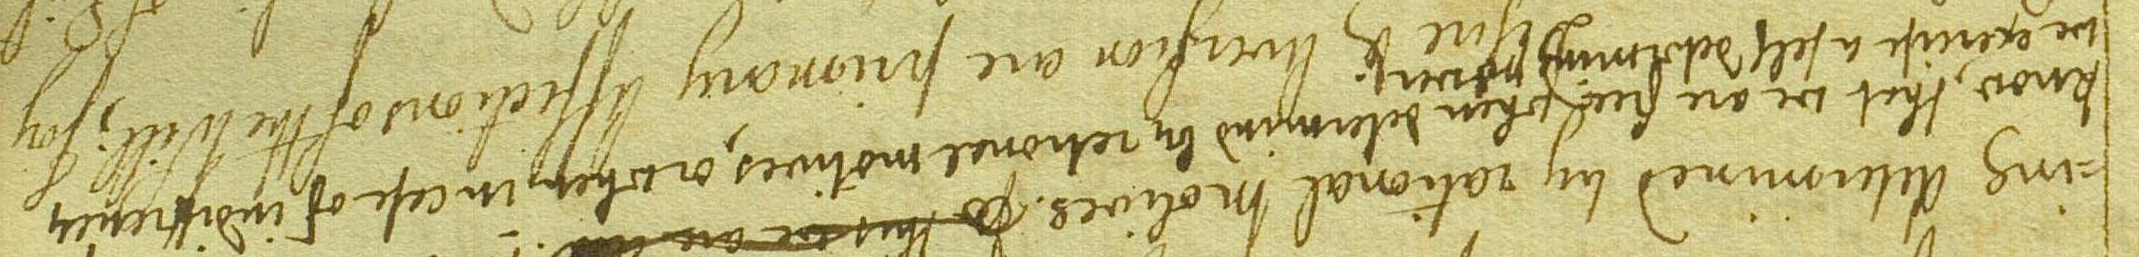know, that we are free when determind by rational motives, or when in case of indifference
